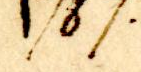1787
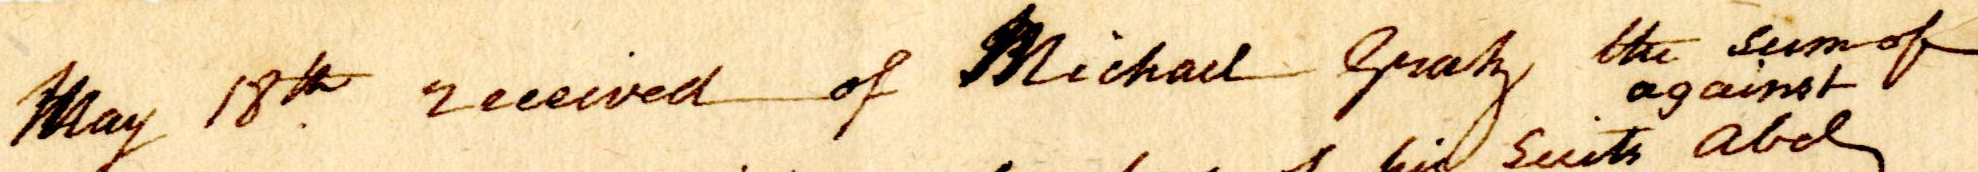May 18^th. received of Michael Gratz the sum of
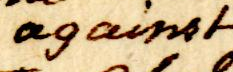against
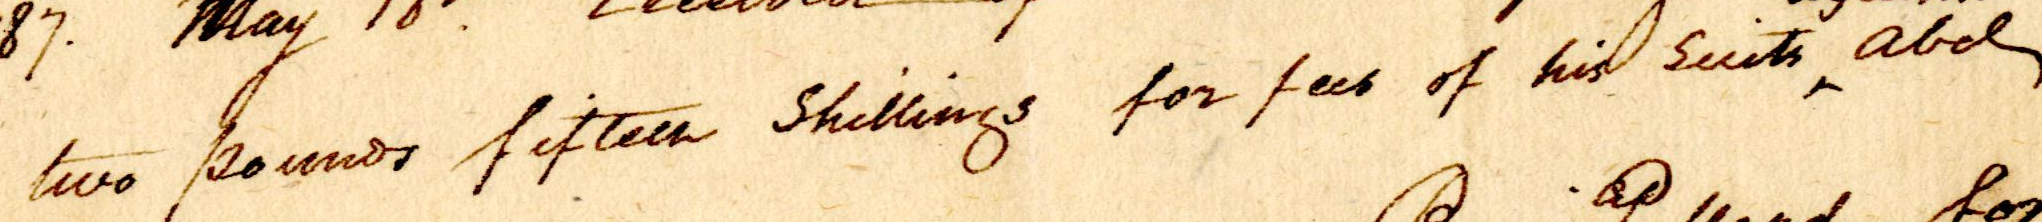two pounds fifteen Shellings for fees of his suits ^ Abel
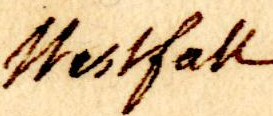Westfall
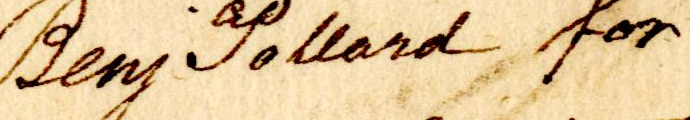Benj Pollard for
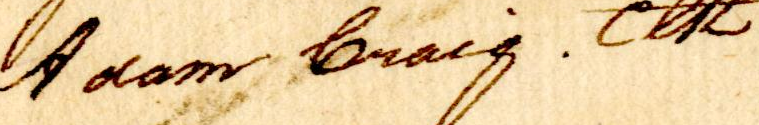Adam Craig. Clk
